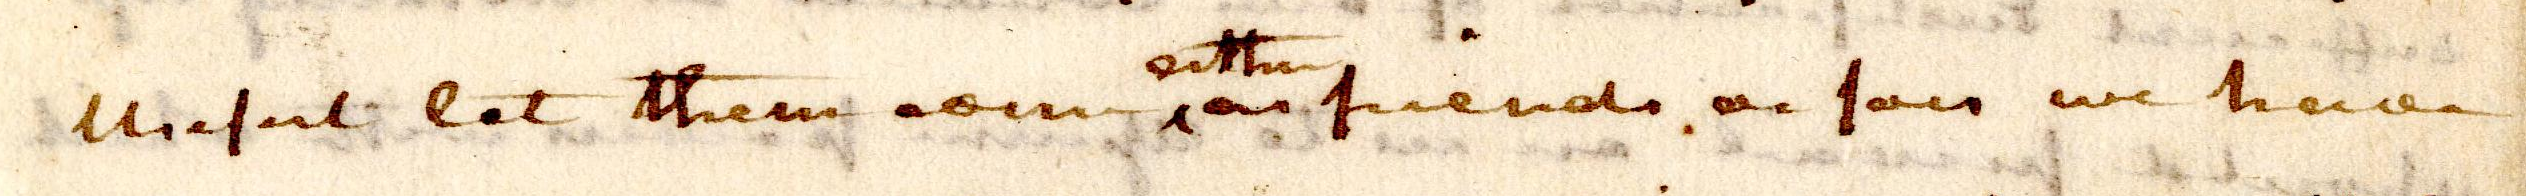Useful let them come ^ as friends or foes we have
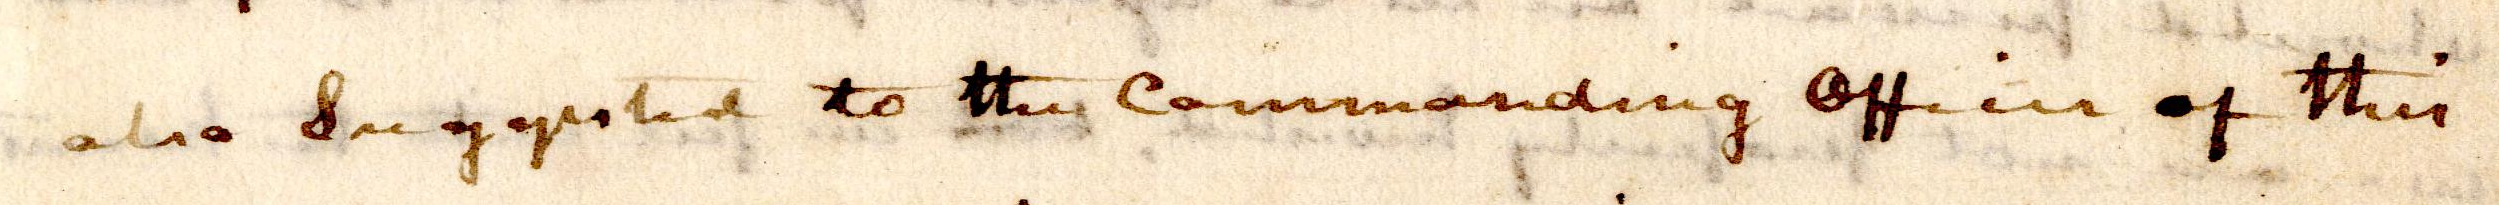also suggested to this Commanding Officer of this
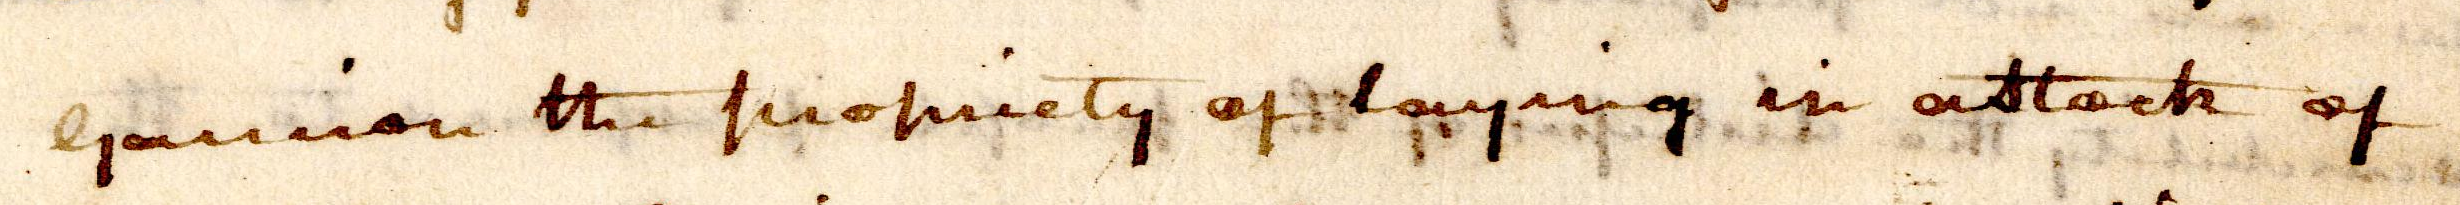Garrison the propriety of laying in attack of
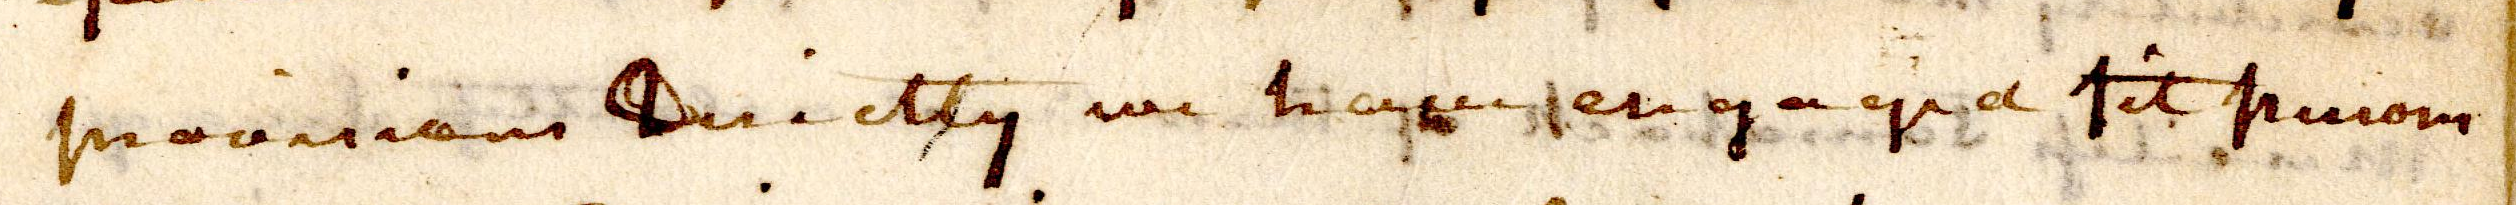provisions Directly we have engaged fit persons
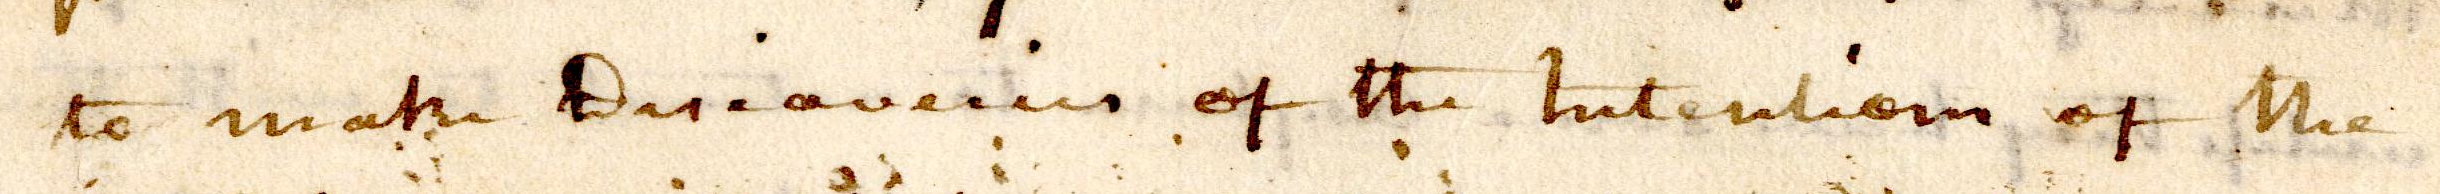to make Discoveries of the Intention of the
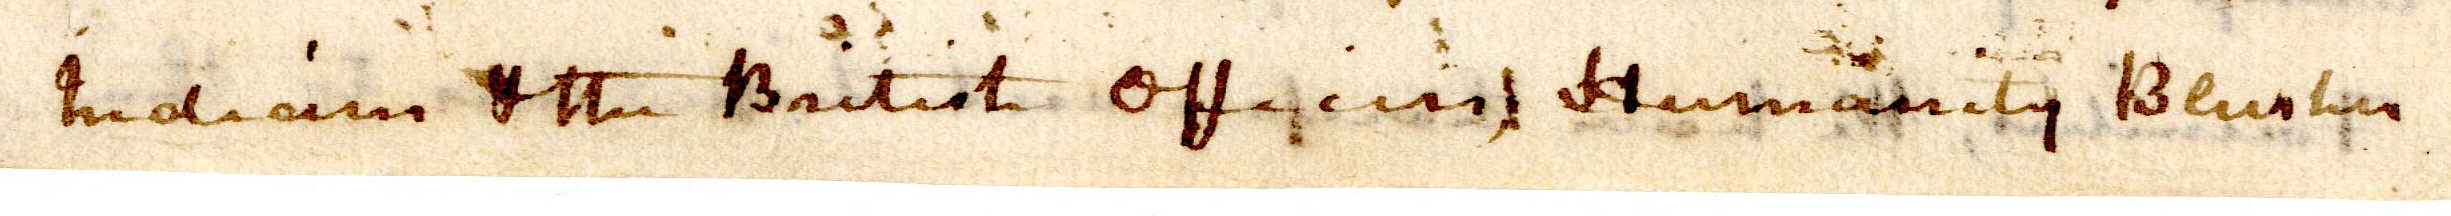Indians & the British Officers, Humanity Blushes
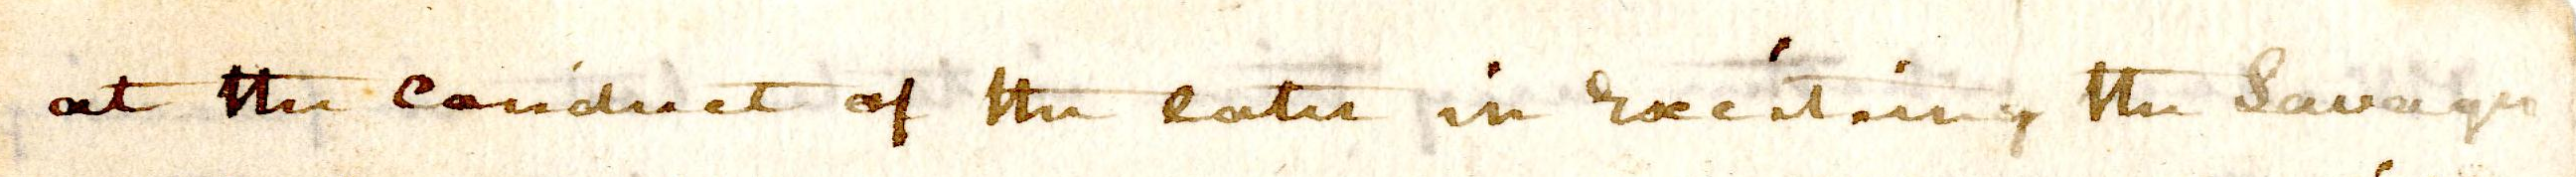at the conduct of the later in Exciting the Savages
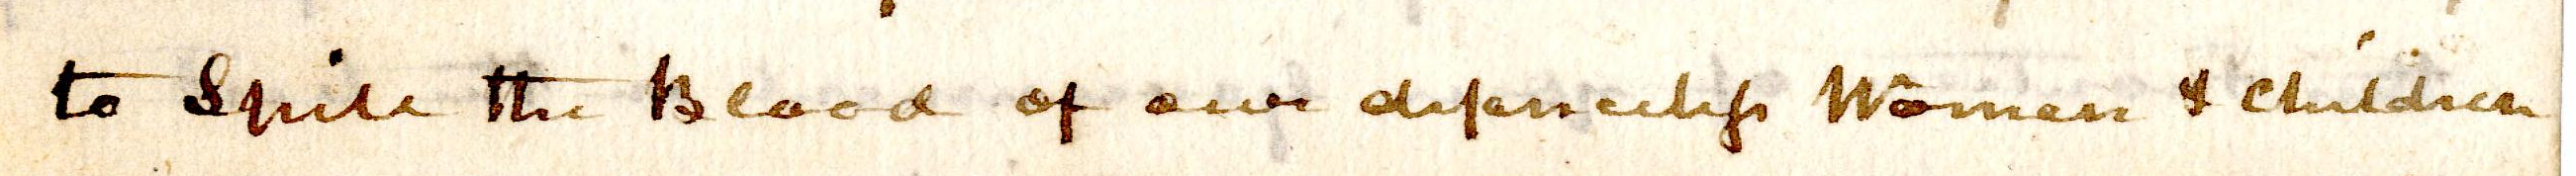to Spill the Blood of our defenceless Women & Children
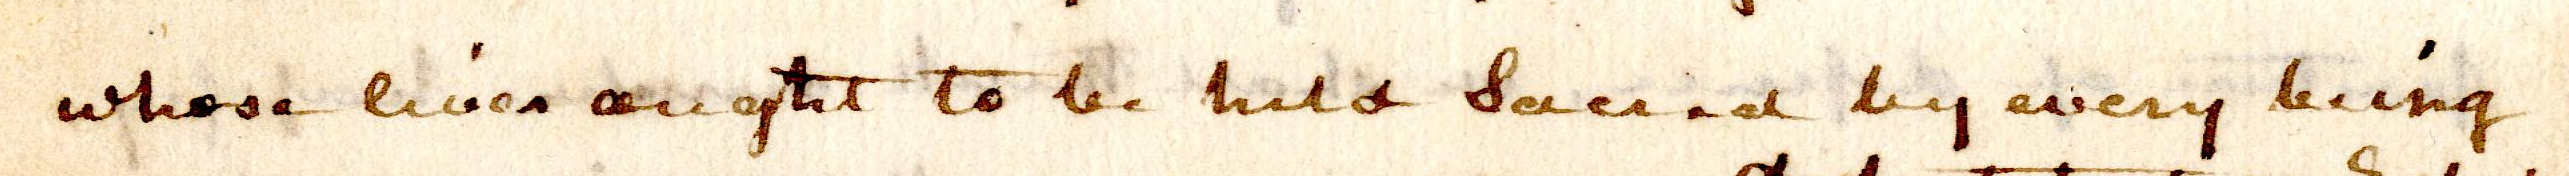whose lives ought to be held Sacred by every being
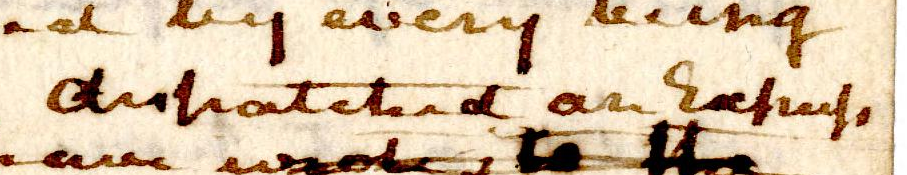dispatched an Express
